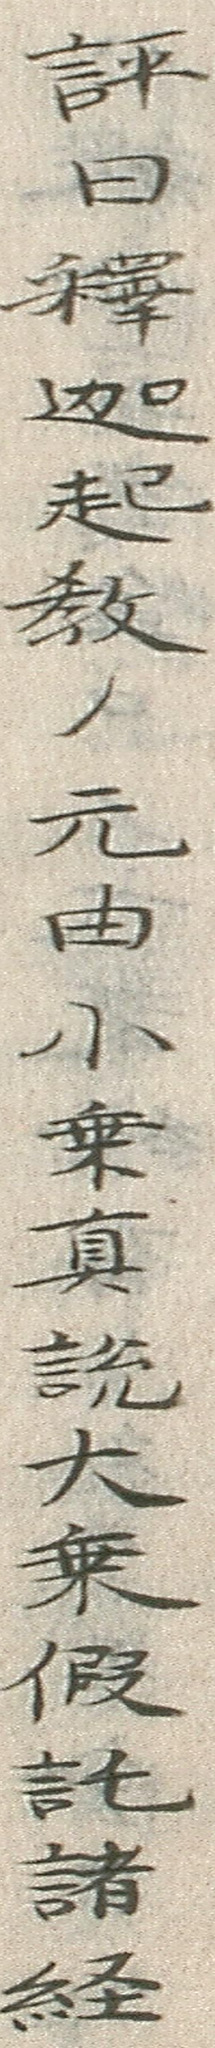評曰釈迦起教ノ元由小乗真説大乗仮託諸経
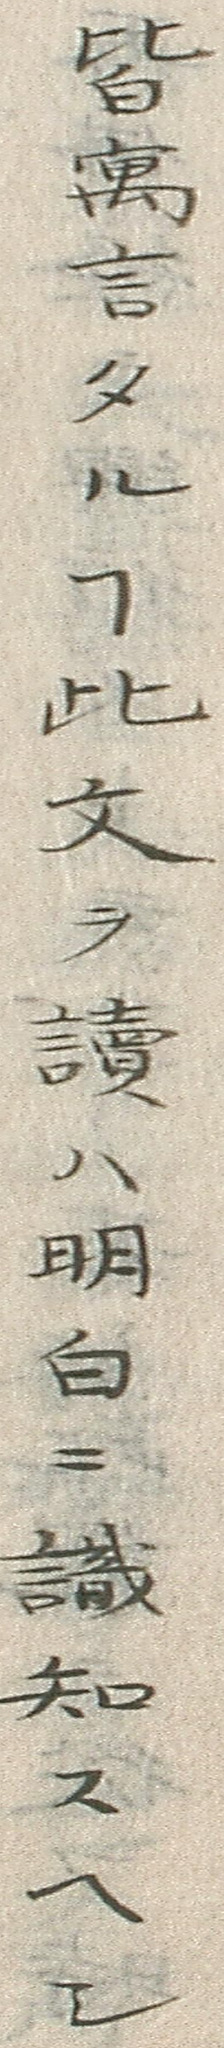皆寓言タルコト此文ヲ読ハ明白ニ識知スヘシ
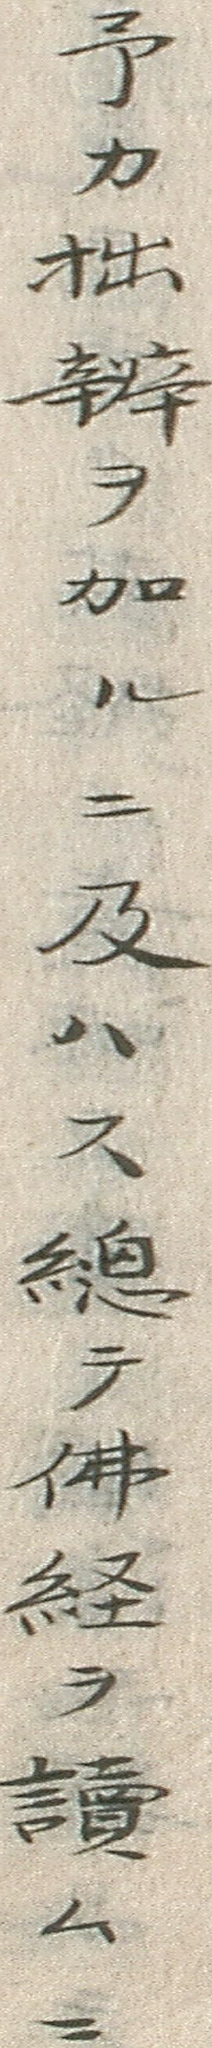予カ拙弁ヲ加ルニ及ハス総テ仏経ヲ読ムニ
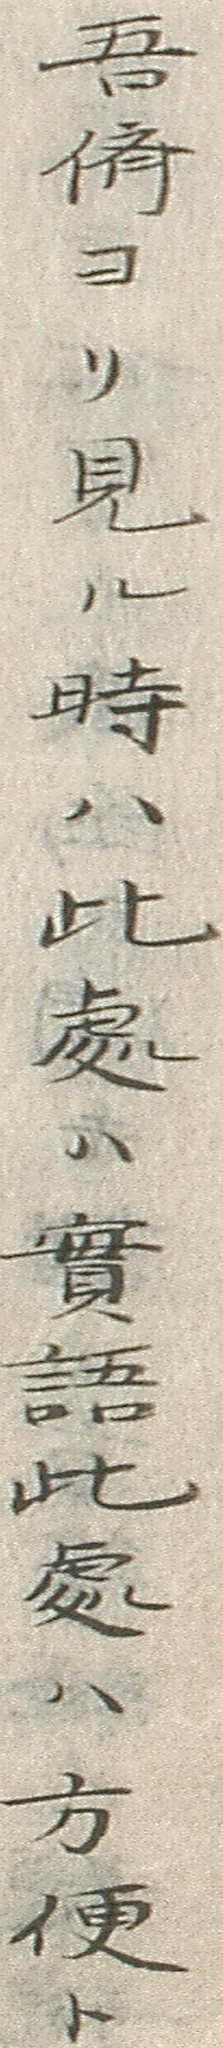吾儕ヨリ見ル時ハ此処ハ実語此処ハ方便ト
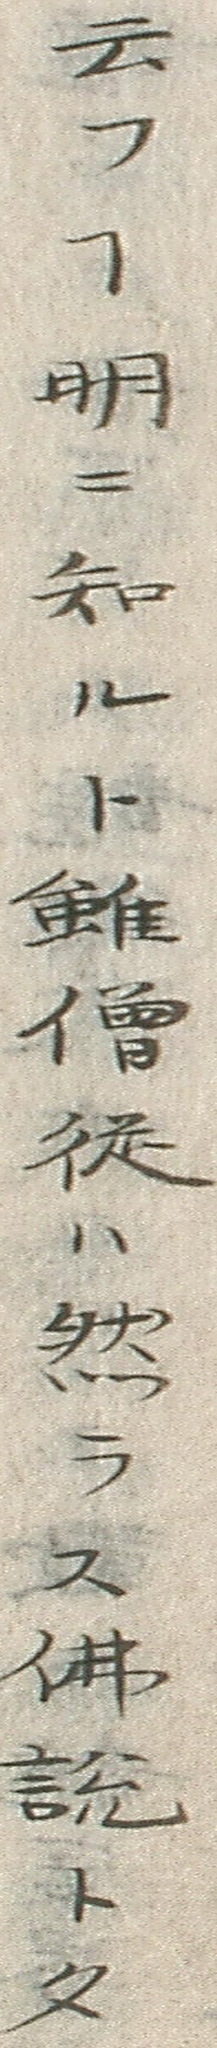云フコト明ニ知ルト雖僧徒ハ然ラス仏説トタ
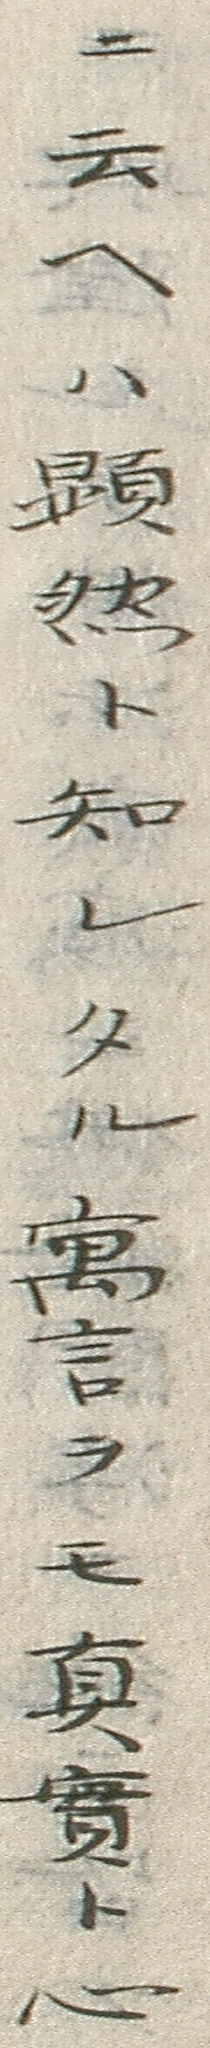ニ云ヘハ顕然ト知レタル寓言ヲモ真実ト心
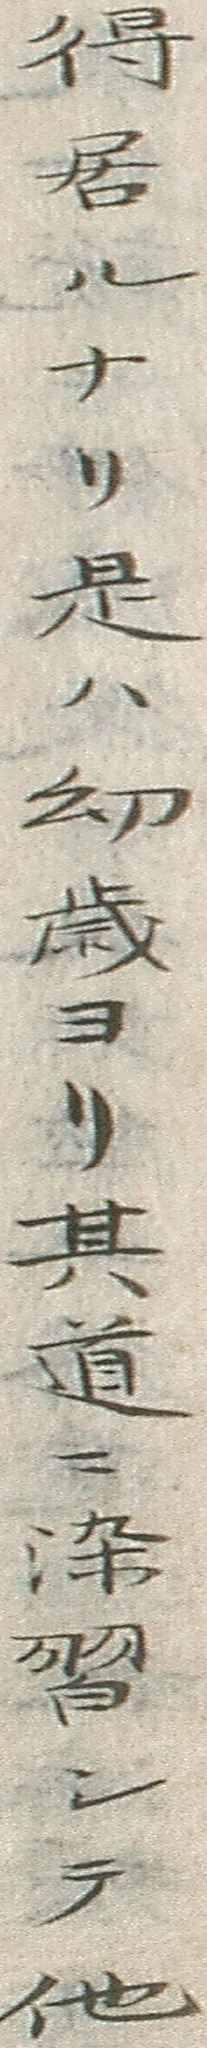得居ルナリ是ハ幼歳ヨリ其道ニ染習シテ他
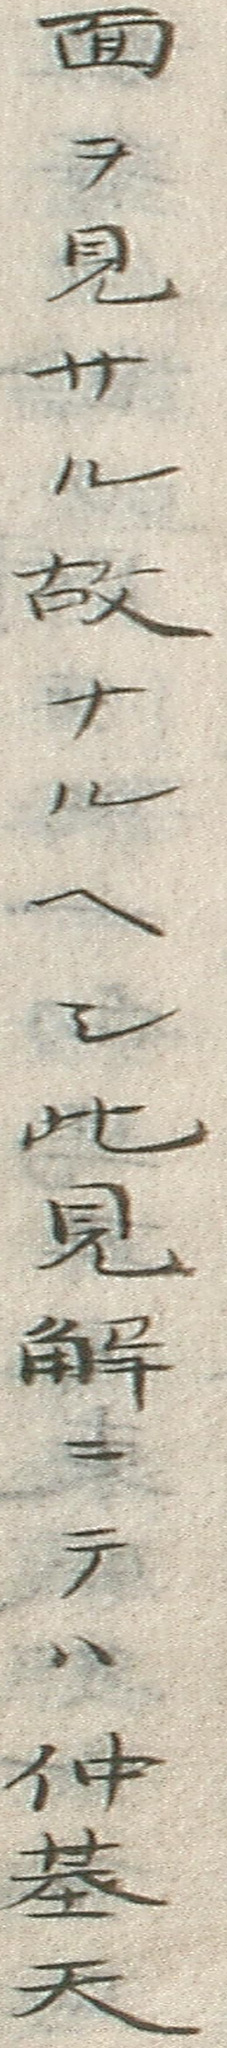面ヲ見サル故ナルヘシ此見解ニテハ仲基天

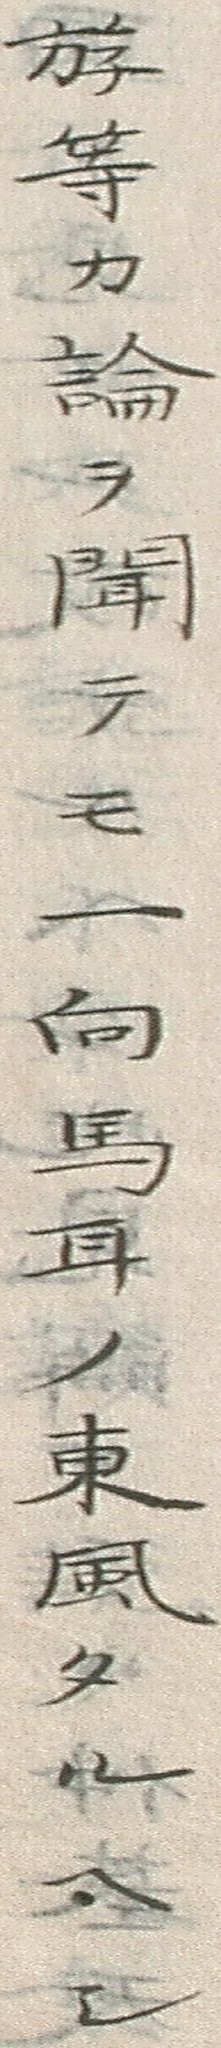游等カ論ヲ聞テモ一向馬耳ノ東風タルヘシ
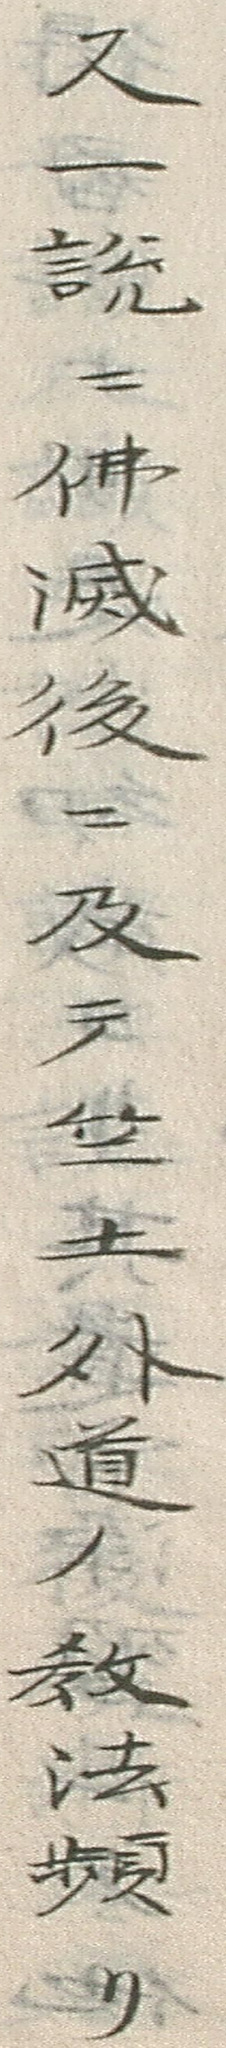又一説ニ仏滅後ニ及テ竺土外道ノ教法頻リ
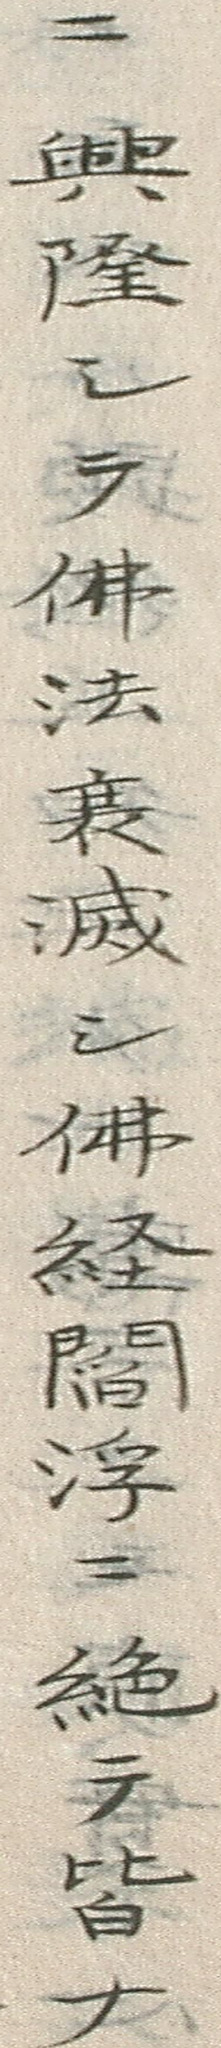ニ興隆シテ仏法衰滅シ仏経閻浮ニ絶テ皆ナ
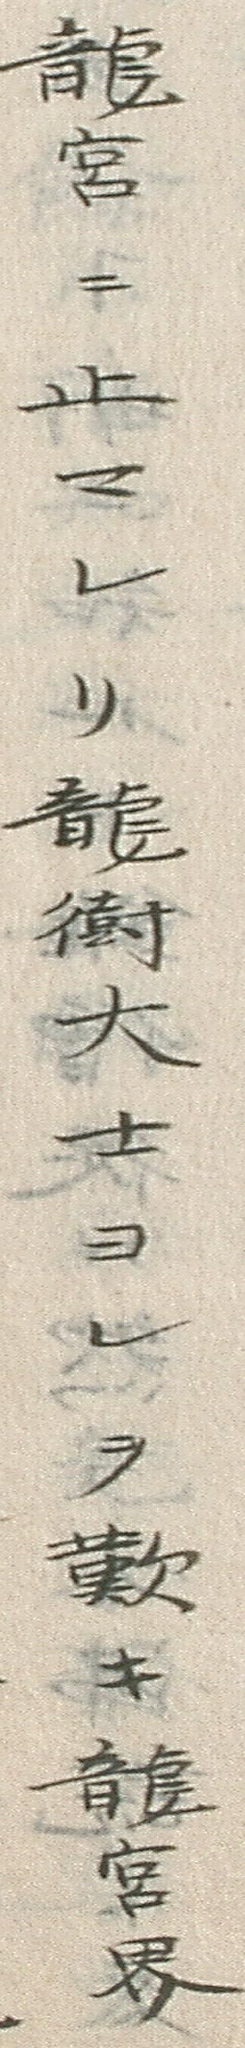龍宮ニ止マレリ龍樹大士コレヲ歎キ龍宮界
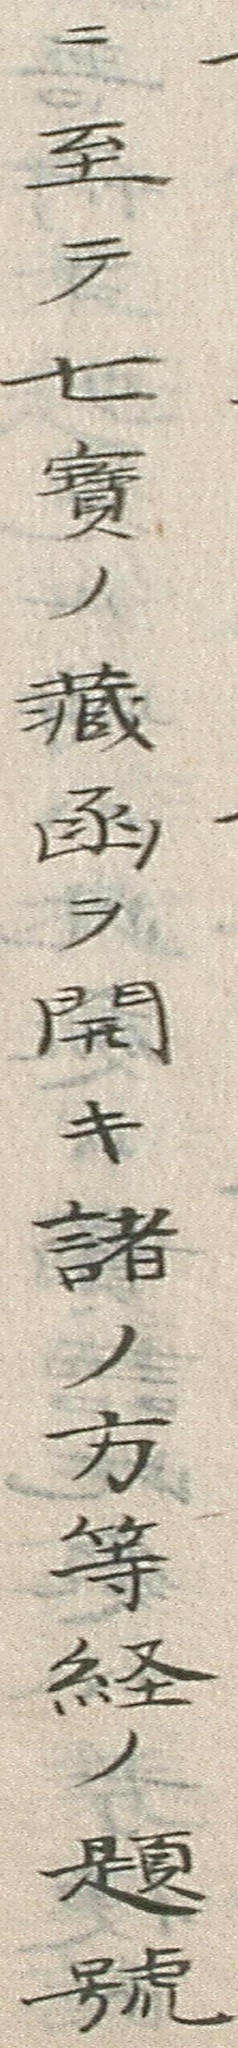ニ至テ七宝ノ蔵函ヲ開キ諸ノ方等経ノ題号
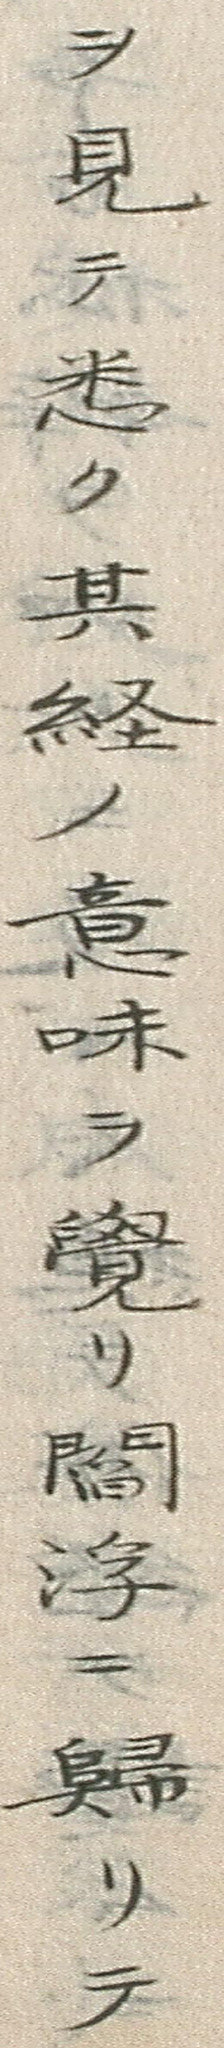ヲ見テ悉ク其経ノ意味ヲ覚リ閻浮ニ帰リテ
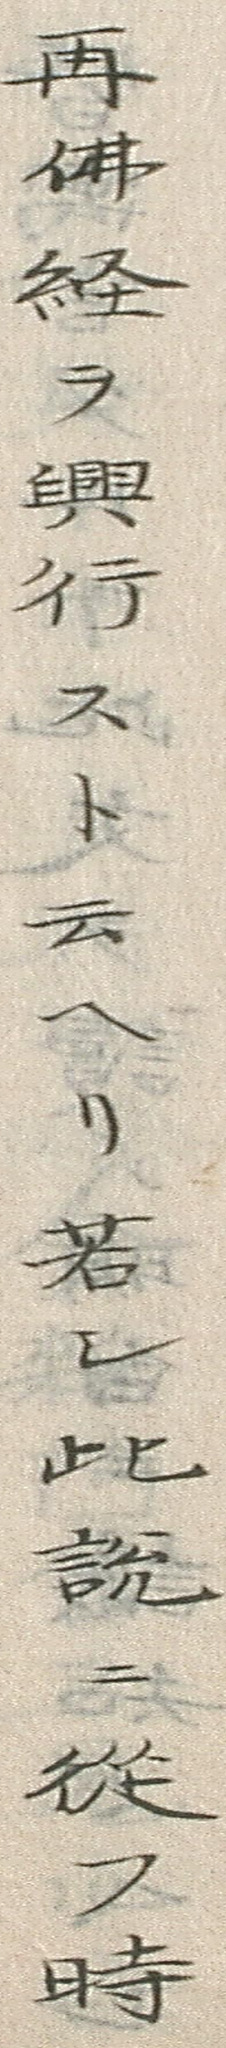再仏経ヲ興行スト云ヘリ若シ此説ニ従フ時
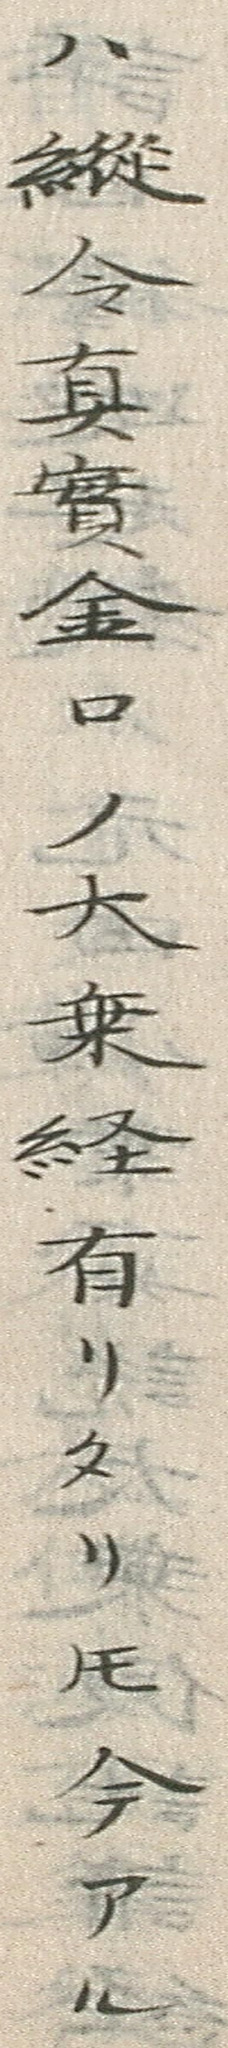ハ縦令真実金口ノ大乗経有リタリトモ今アル
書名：天學略名目羽翼　全
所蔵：東京大学地震研究所図書室 Earthquake Research Institute Library, The University of Tokyo, JAPAN
